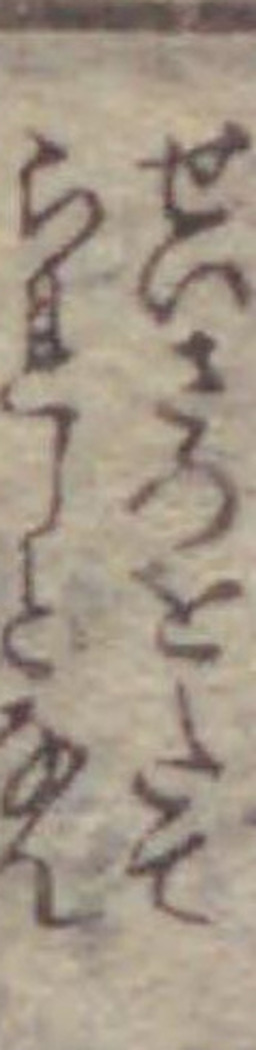られしとなん
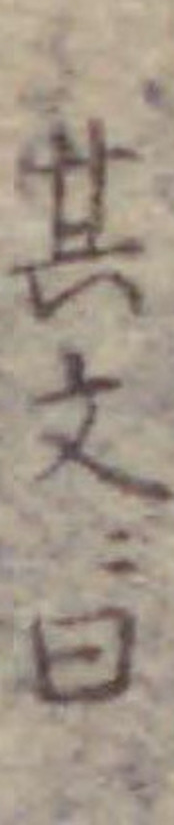其文に曰
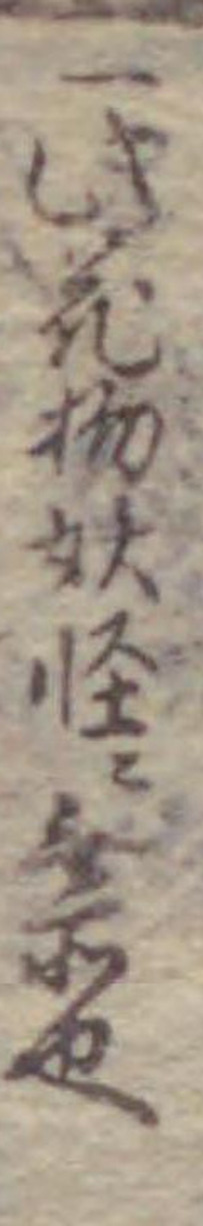一此花物妖怪ニ無所也
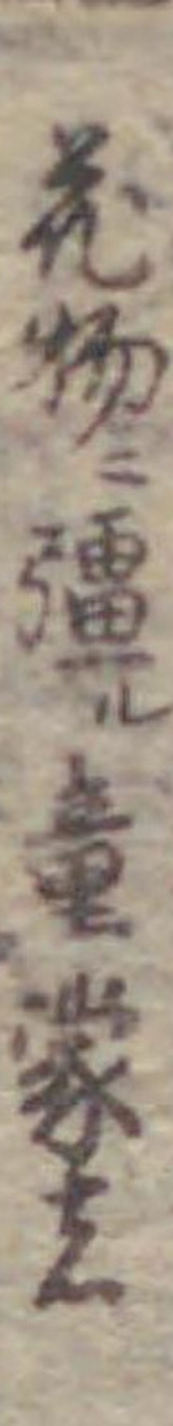花物ニ彊ル童蒙者
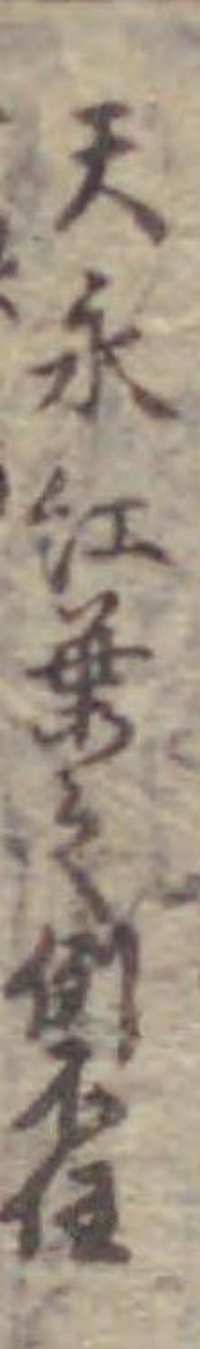天永紅葉之例不任
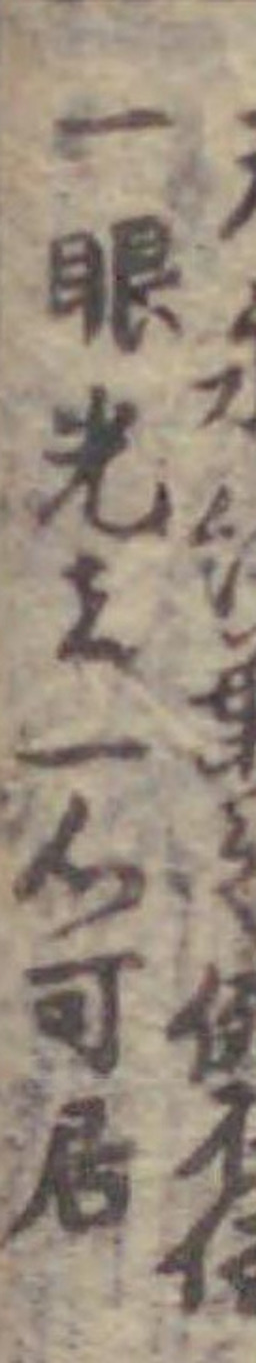一眼光者一心可居
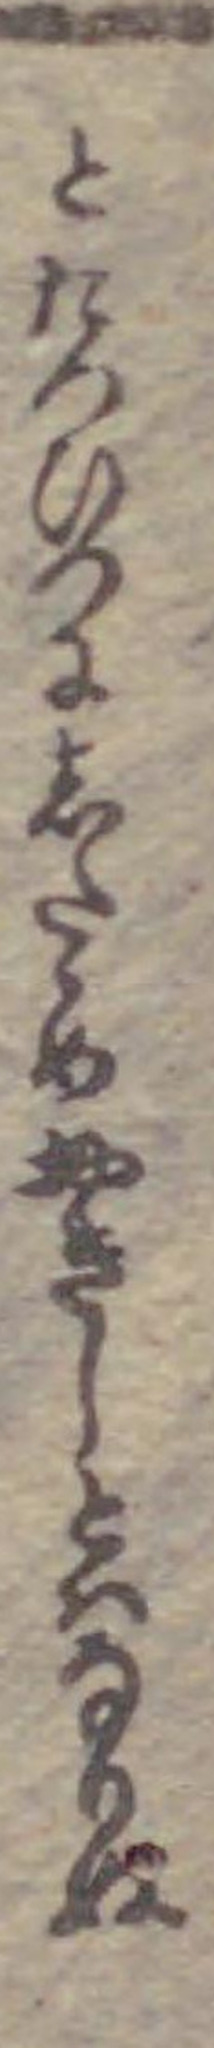とたつひつにしたゝめおきしとはなりぬ
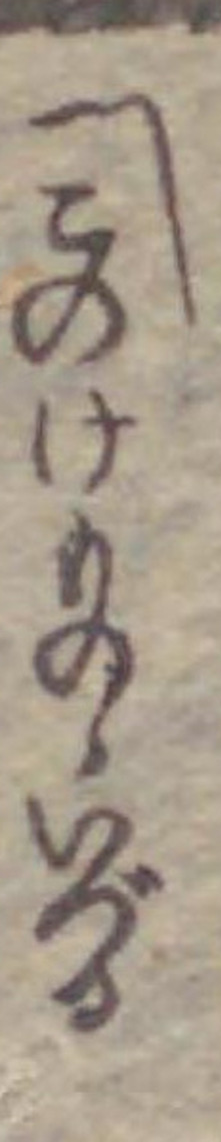〽このけものゝのいづる
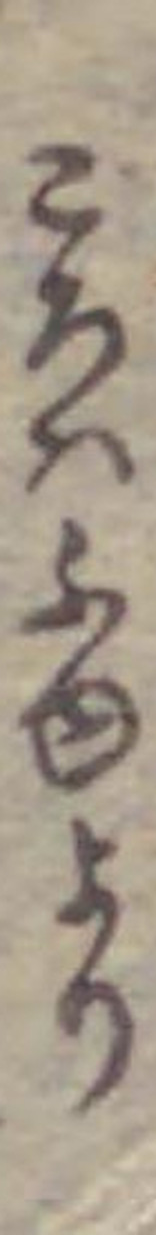ころはふゆより
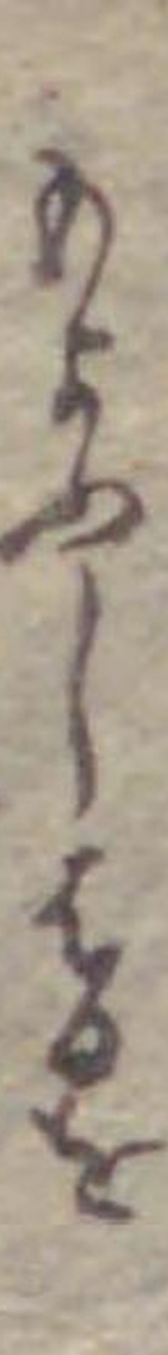もよふしはるを
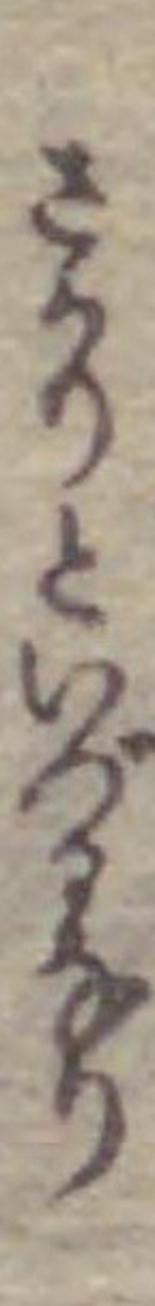さかりといづるなり
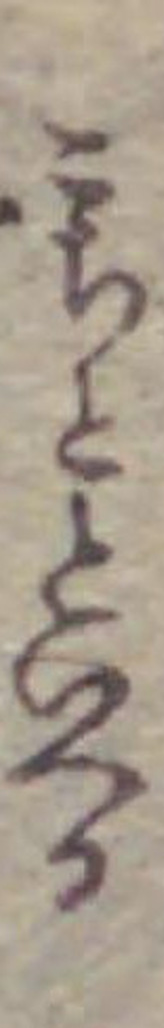こちとといへる
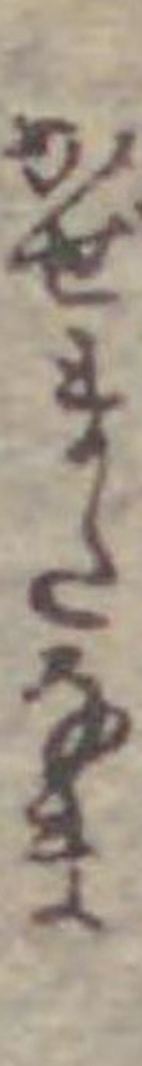かぜまたなま
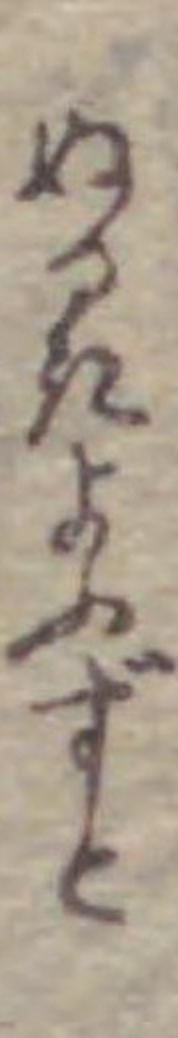ぬるきよふずと
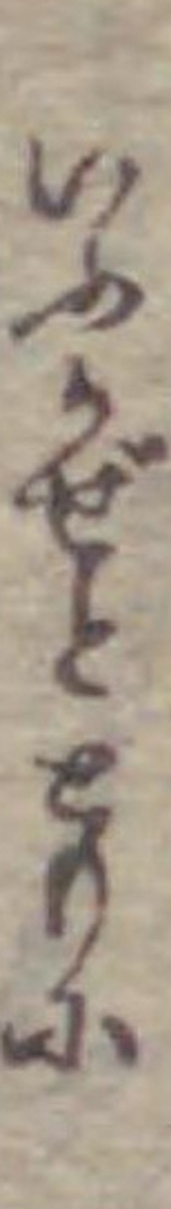いふかぜとともに
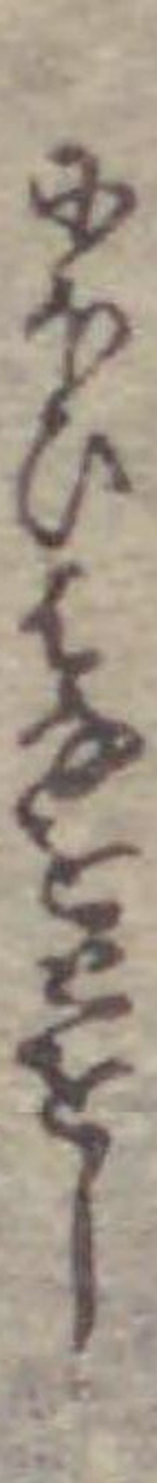にほひはなをとをし
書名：武家物奇談 : 3巻
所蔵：国立国会図書館 National Diet Library, JAPAN
